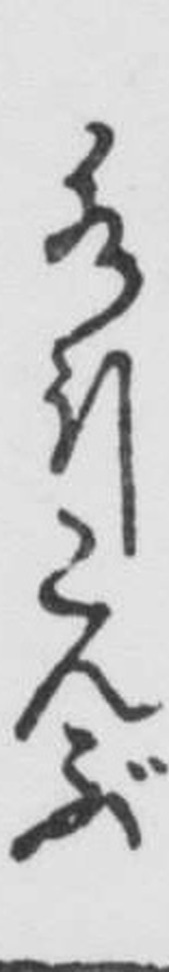水引こんぶ
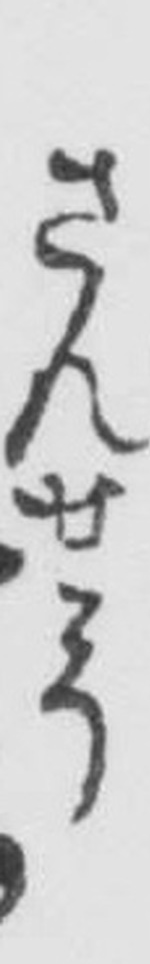さんせう
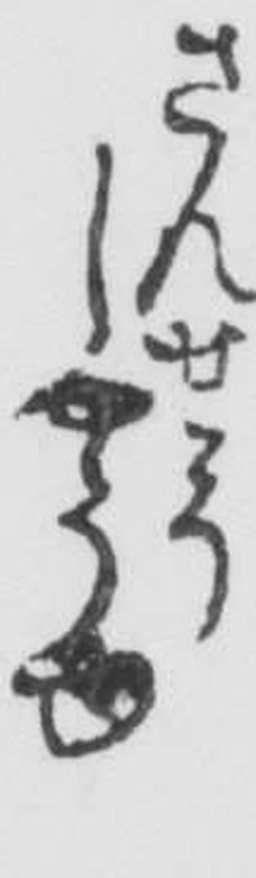しやうゆ
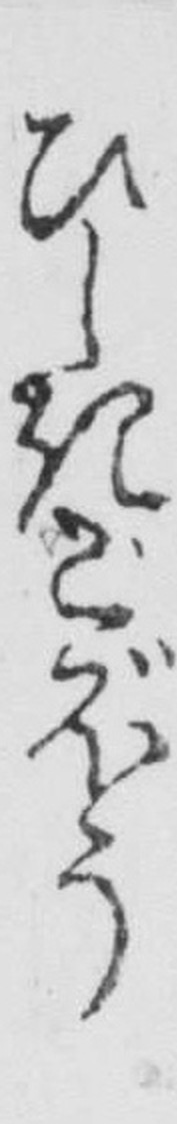ひしきこぼう
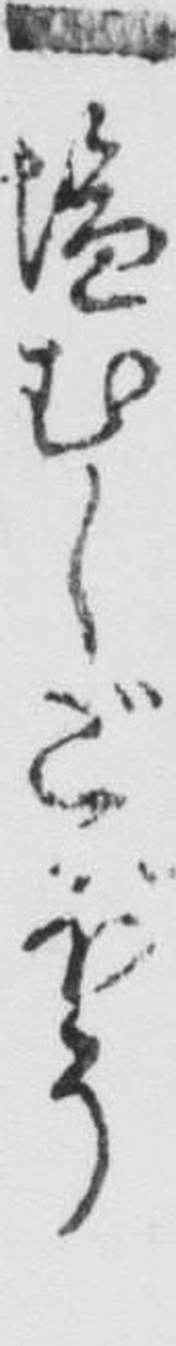塩むしごぼう
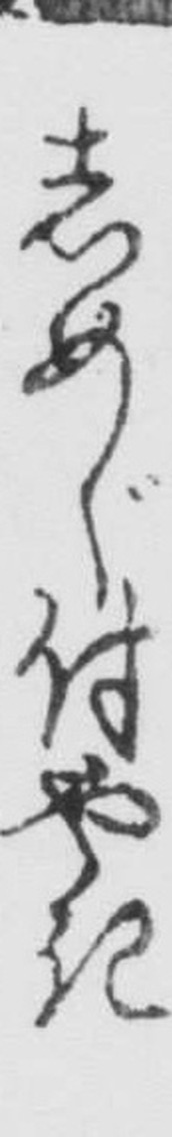しめじ付やき
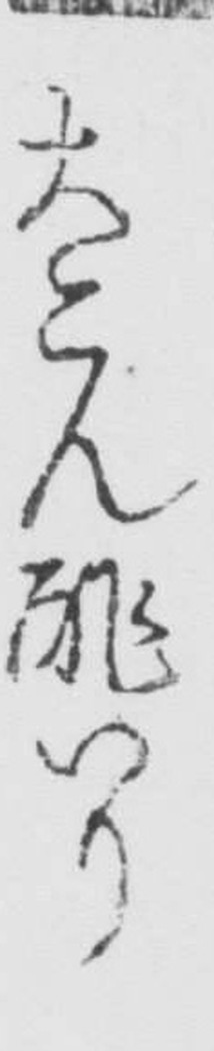台こん酢いり
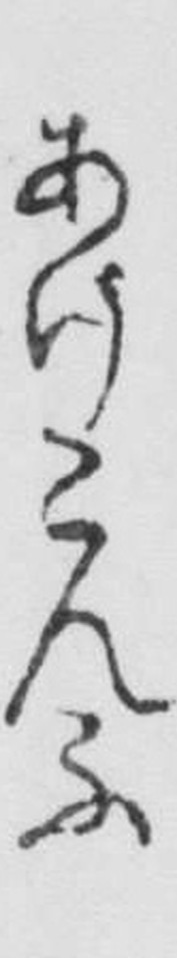あけこんふ
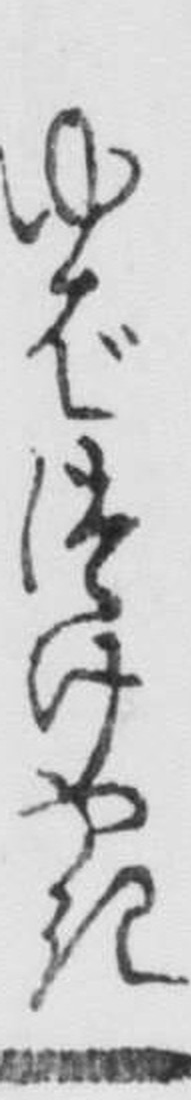ゆばつけやき
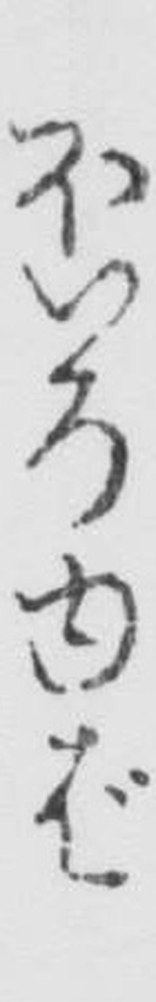ほいろゆば
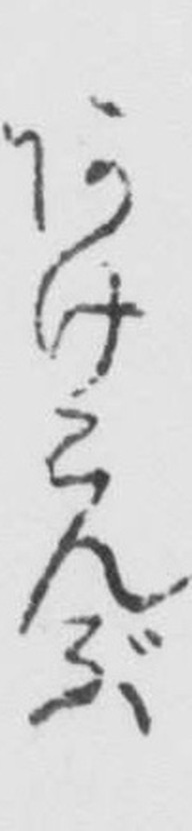あけこんぶ
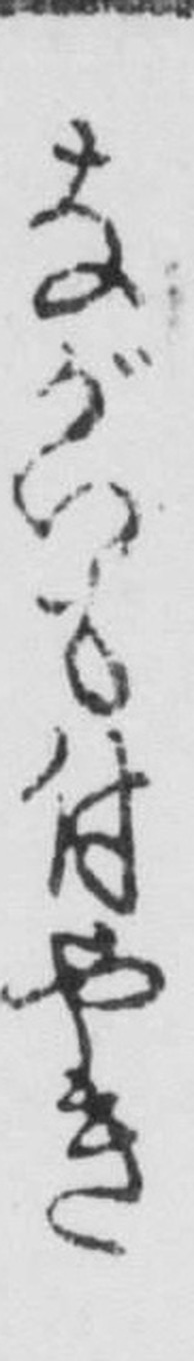ながいも付やき
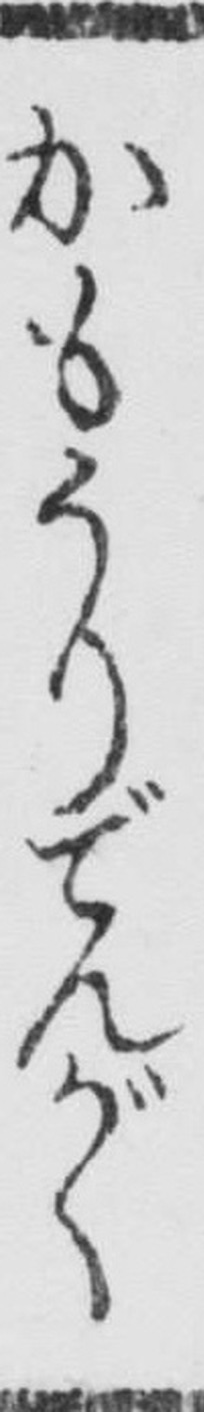かもうりでんがく
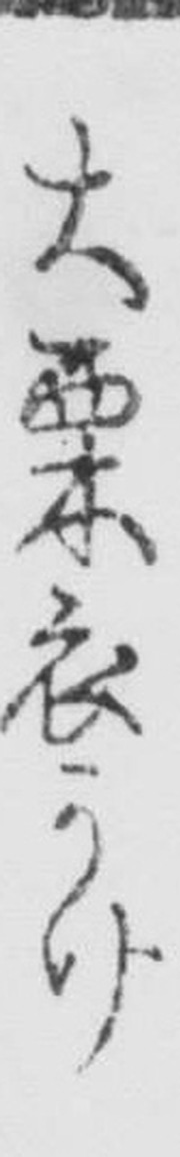大栗衣かけ
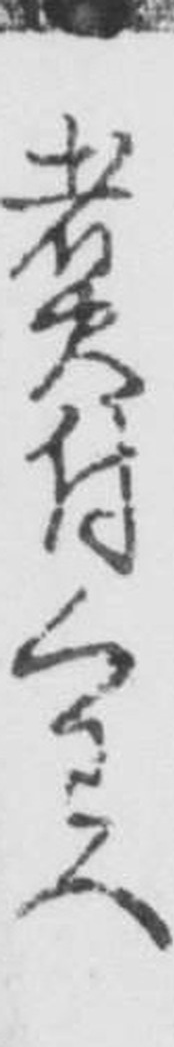煮付くわへ
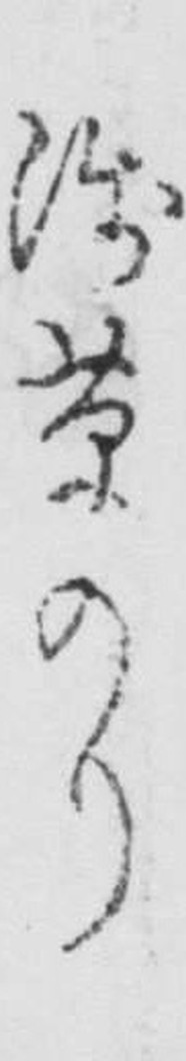浅草のり
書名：諸家通用/即席料理
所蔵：大阪府立大学学術情報センター 国文学研究資料館
